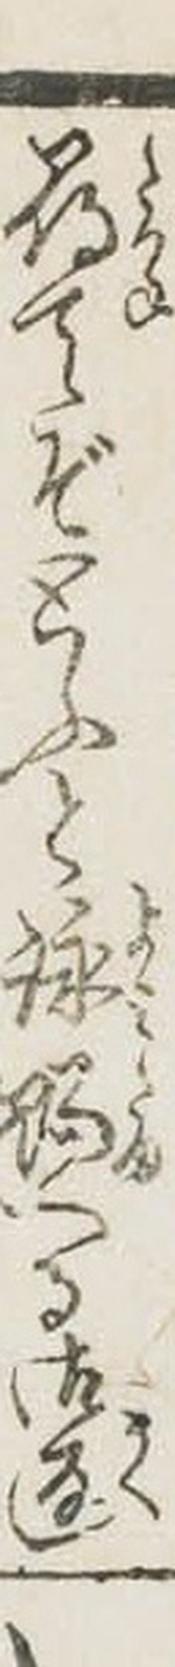尋てぞとふと詠賜へる御返
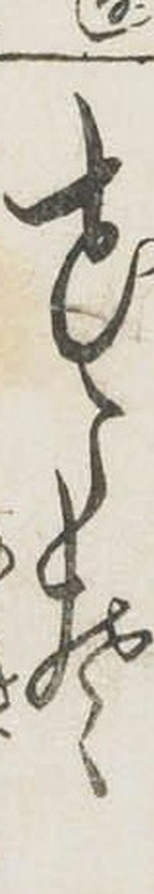花こそ
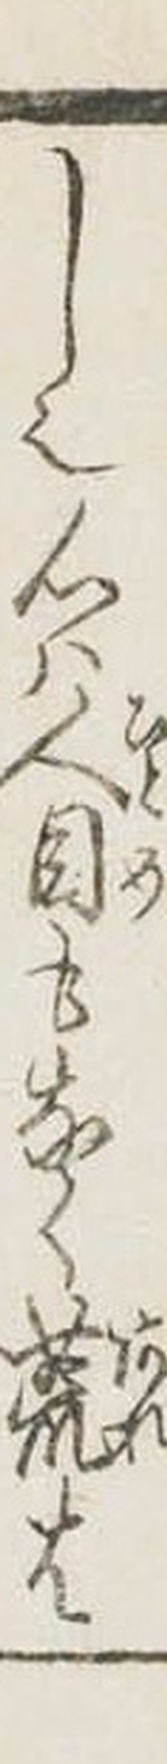し也心は人目もなく荒は
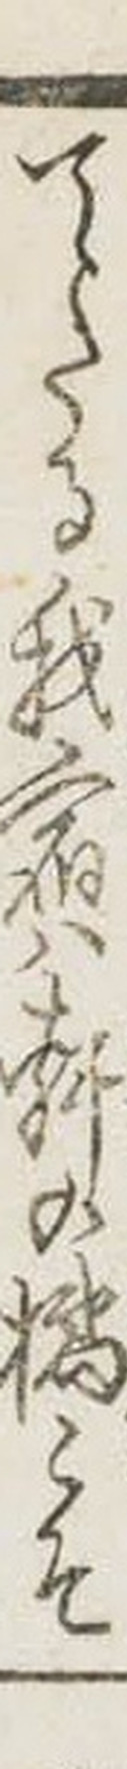てたる我宿は軒の橘こそ
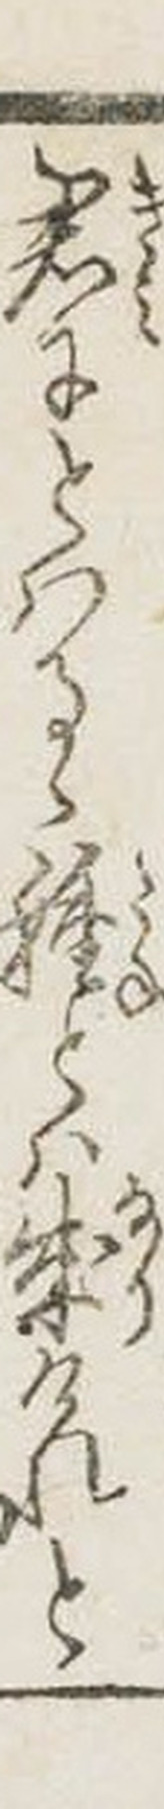君にとはるゝ種とは成けれと
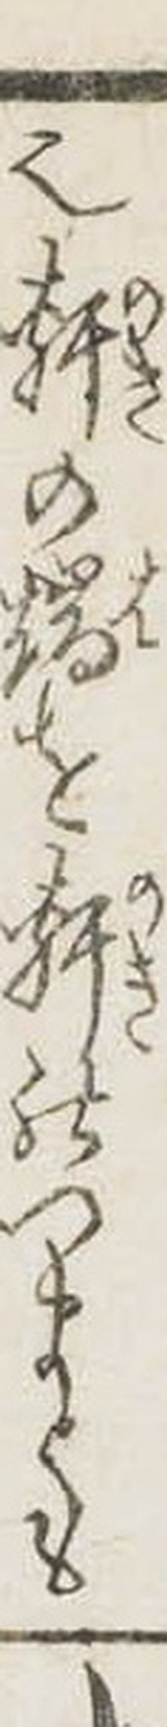也軒の端を軒のつまとも
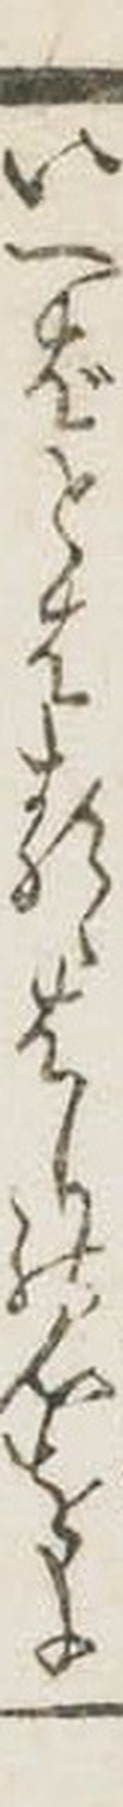いへばとはるゝはしの心をよ
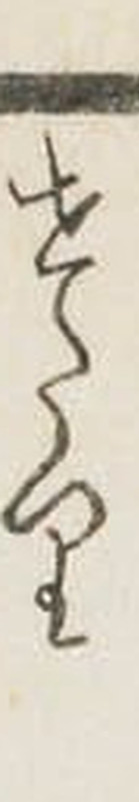せたり
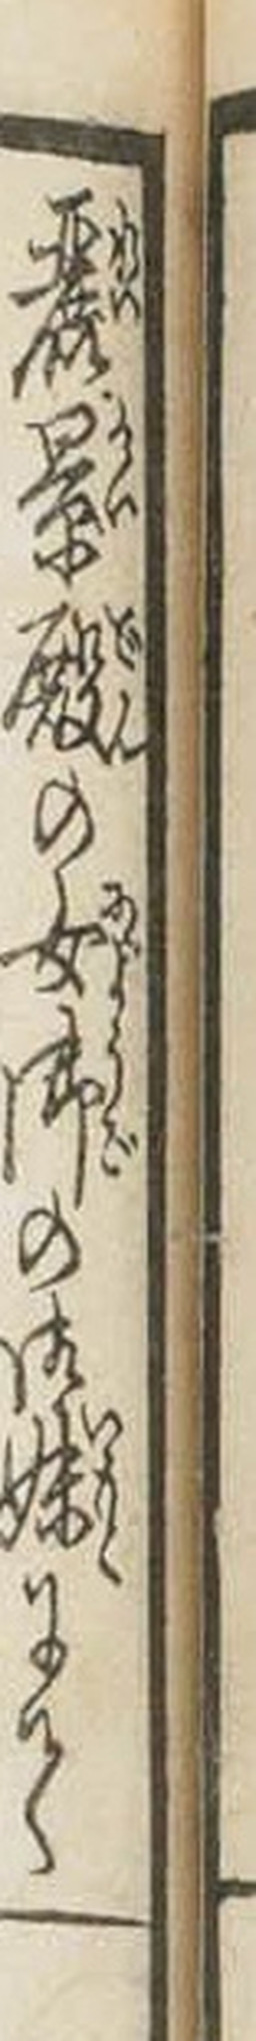麗景殿の女御の御妹にて
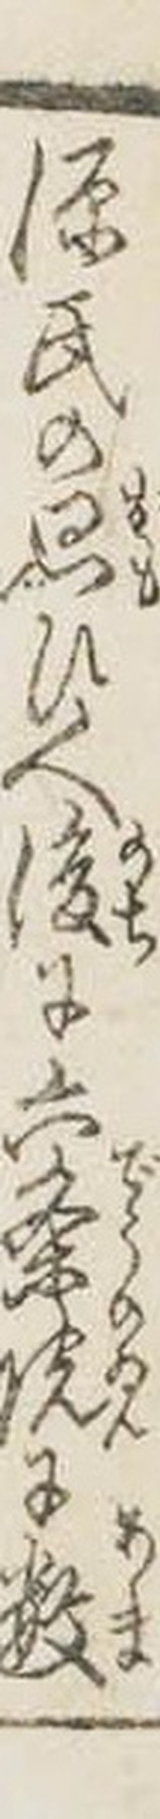源氏の思ひ人後に六条院に数
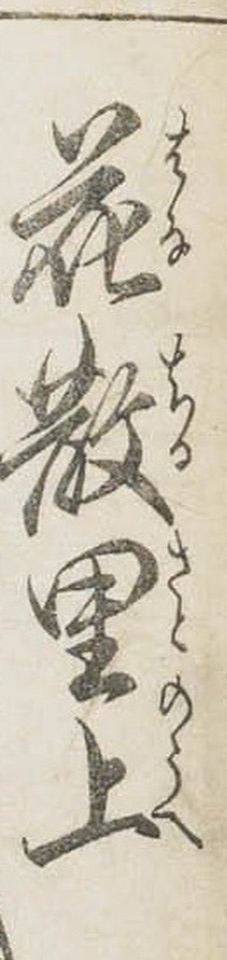花散里上
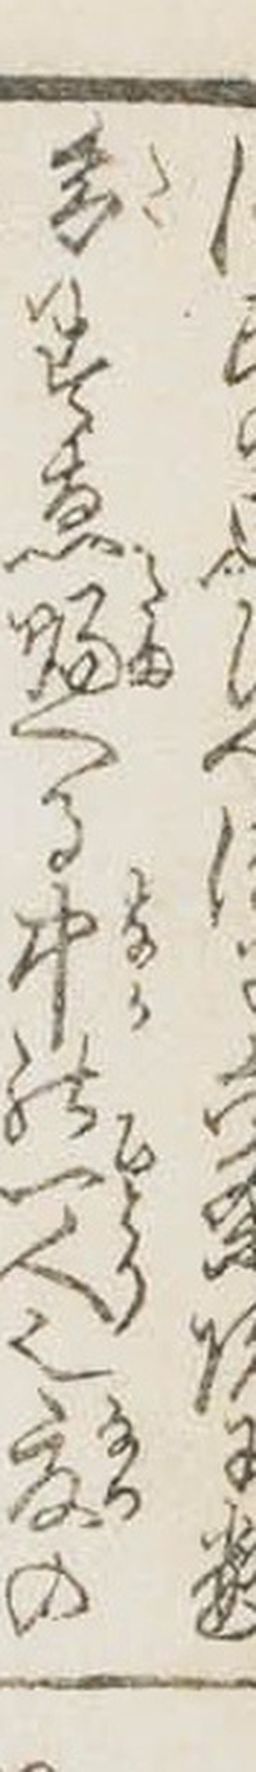多すゑ賜へる中の一人也夏の
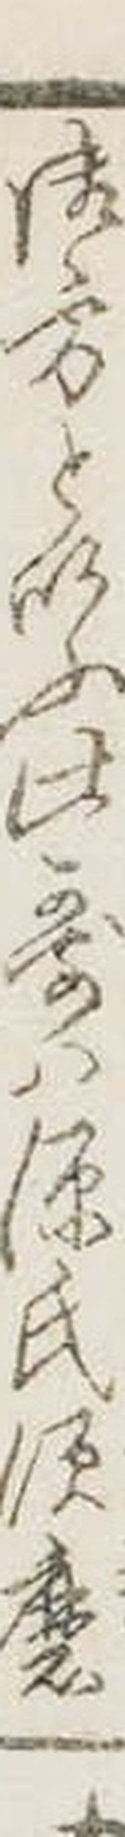御方といふ此哥は源氏須磨
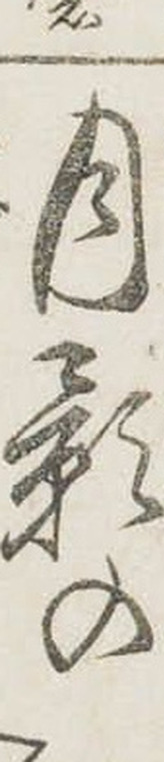月影の
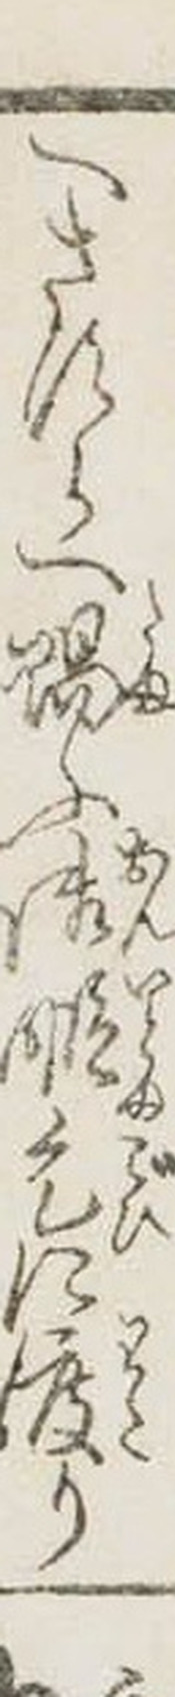へさすらへ賜ふ御暇乞に渡り
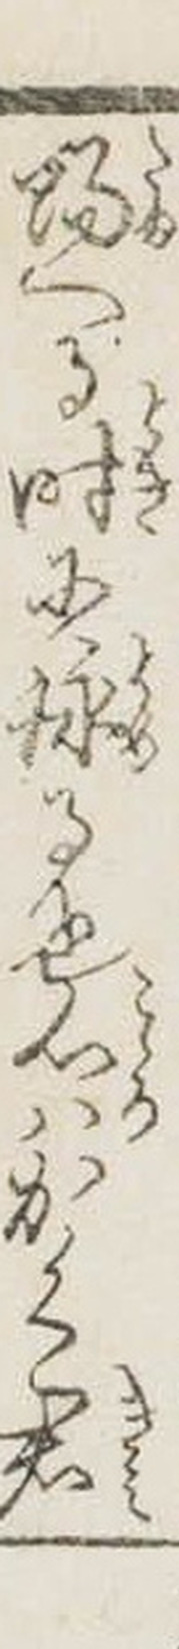賜へる時に詠る也心はかく君
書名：源氏百人一首
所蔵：東京学芸大学教育コンテンツアーカイブ
